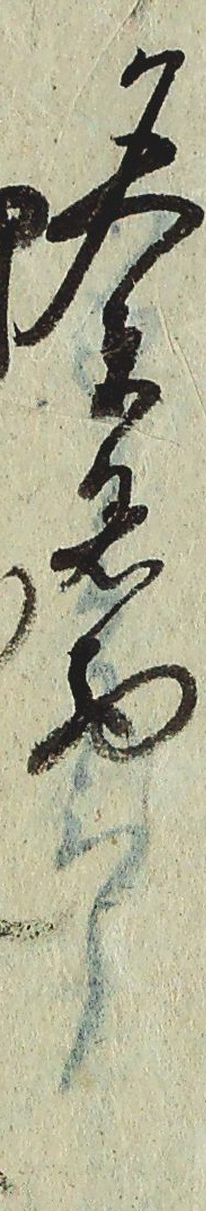名東名西
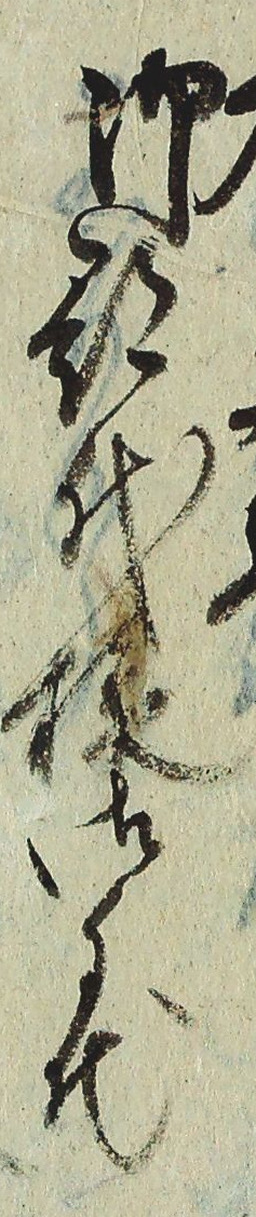御郡代様御手代
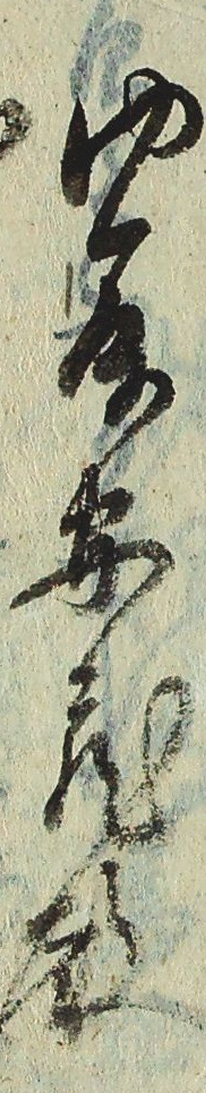内藤安蔵殿
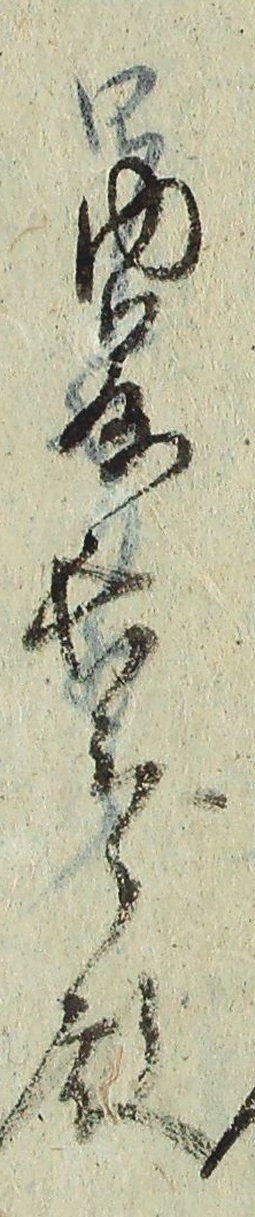内藤長三郎殿

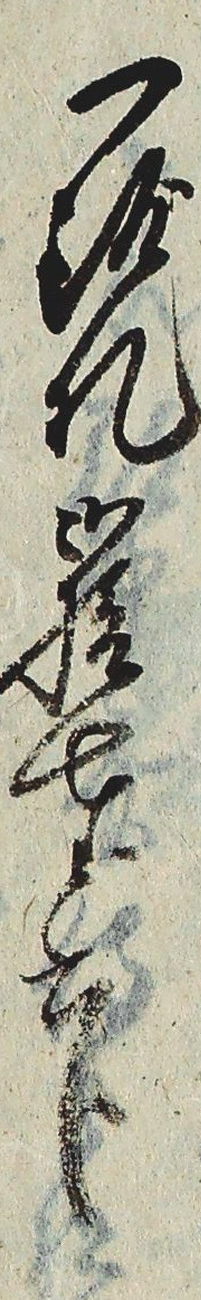一銀札弐拾七匁六分
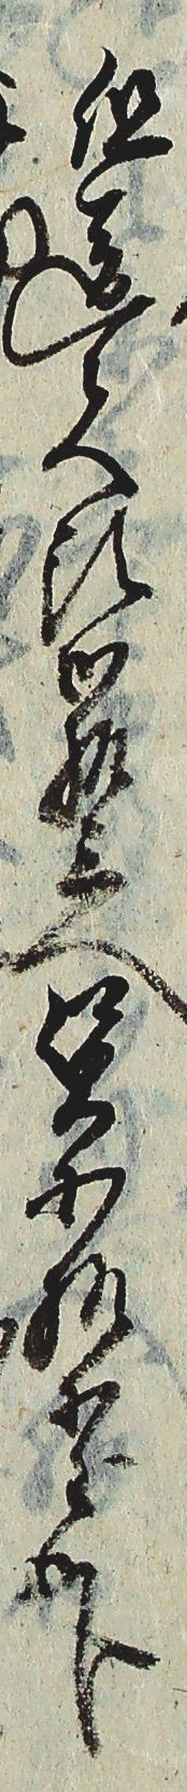但送夫頭弐拾三人賃五拾五匁弐分
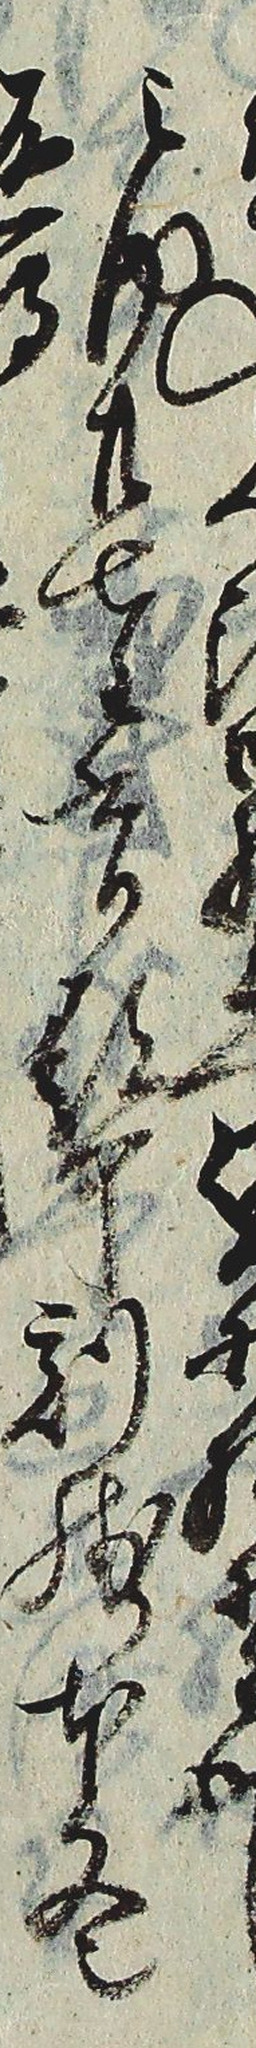之内廿七匁六厘郡中割残り本文之
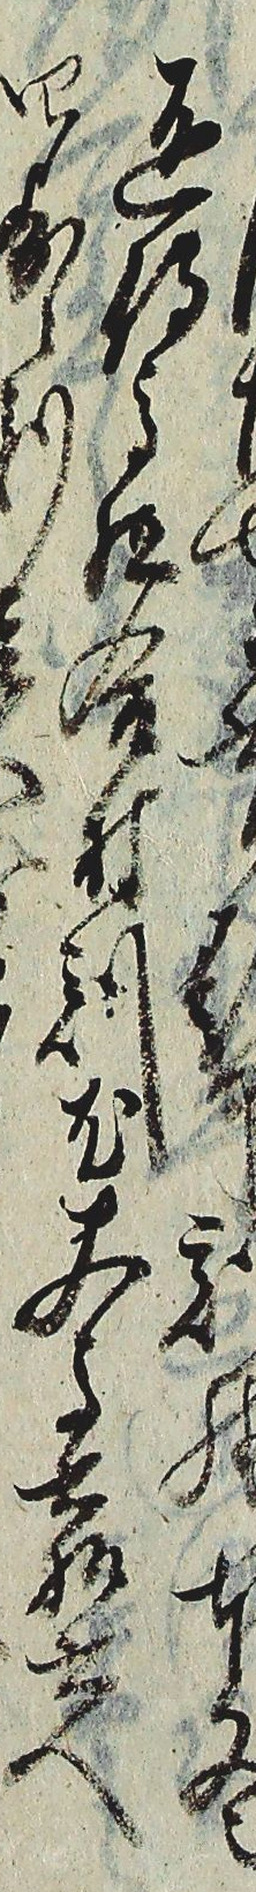通伝馬組合村割尤夫馬七拾六人
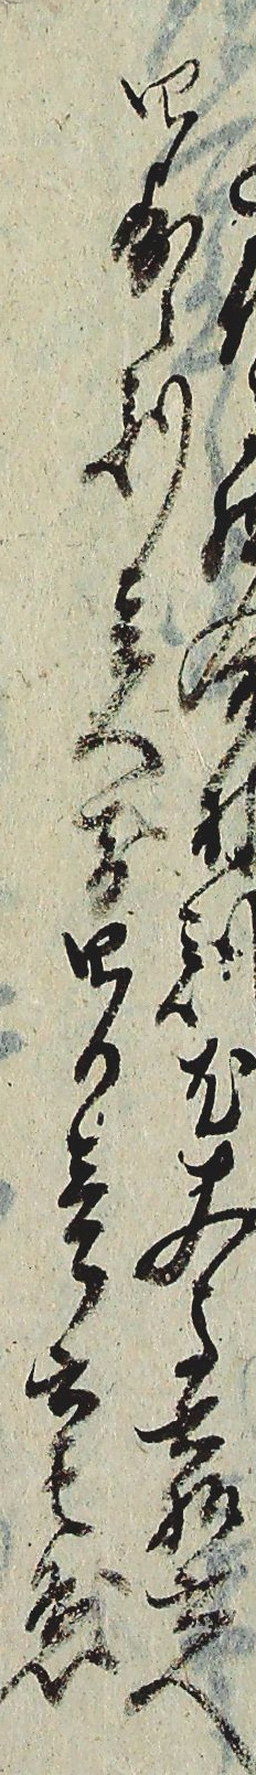四歩に割壱人前四分壱厘六毛懸
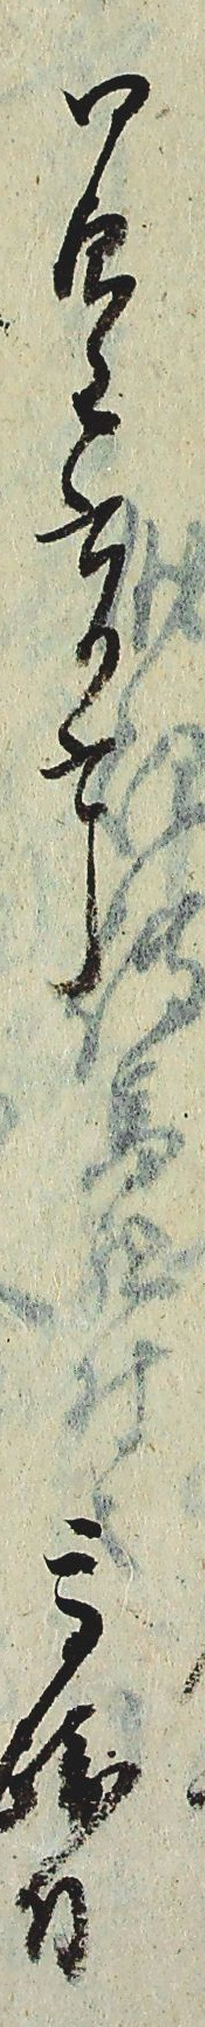同四匁六分六厘高崎村
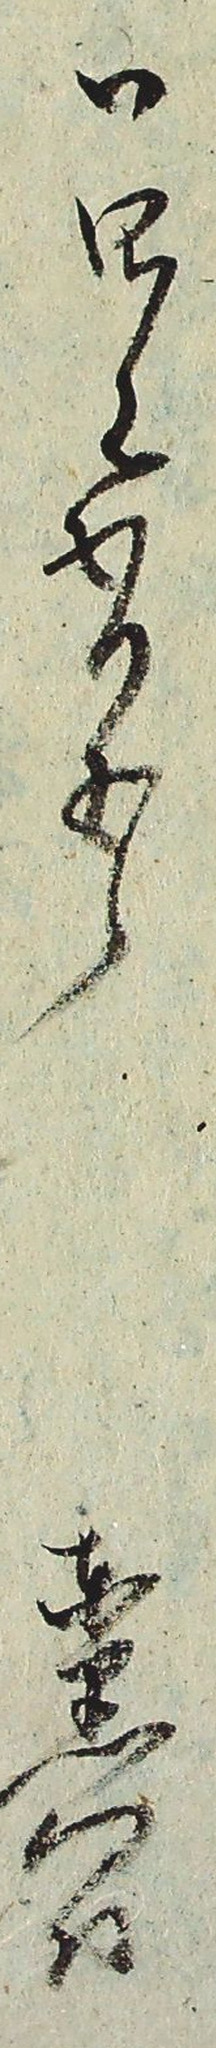同四匁五分五厘東黒田村
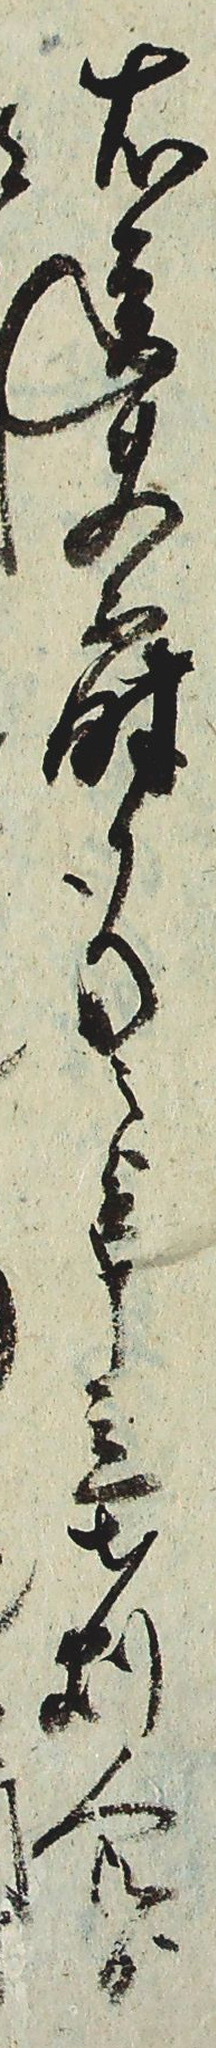右送夫不時御用之旨申立才判人共ゟ
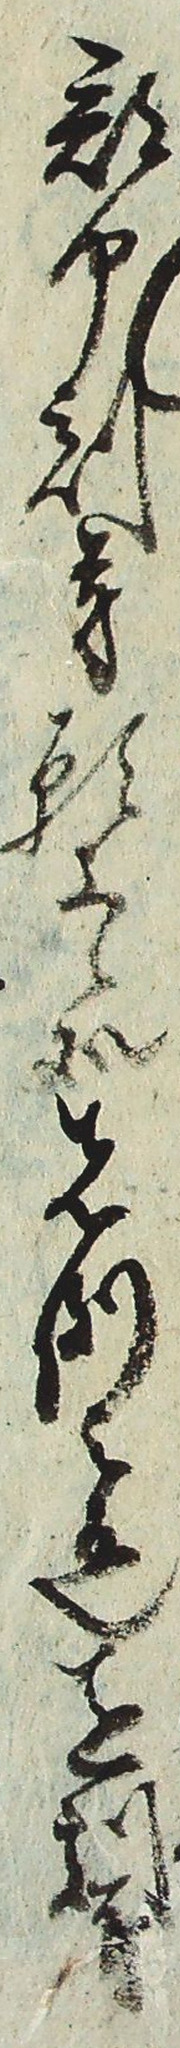郡中割苻願上候処先例之通遂割苻

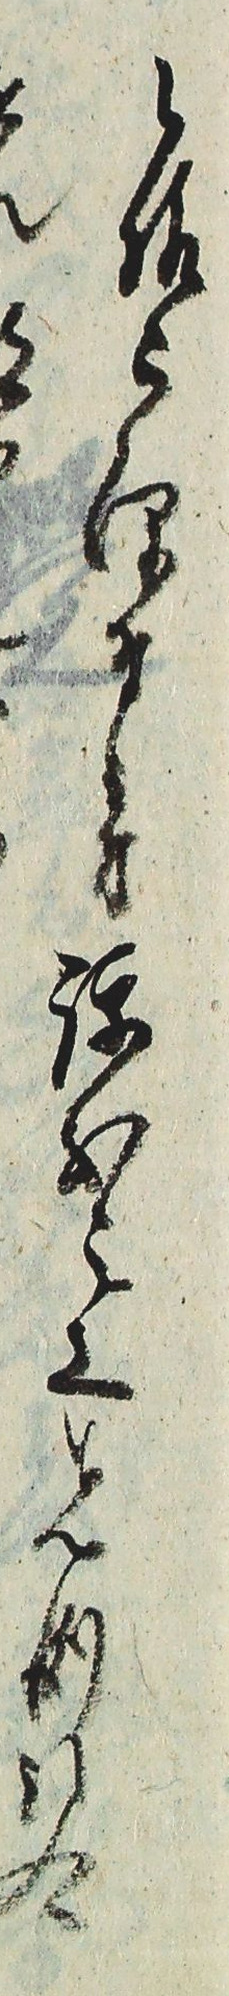候様被仰付候に付評義之上先例引合
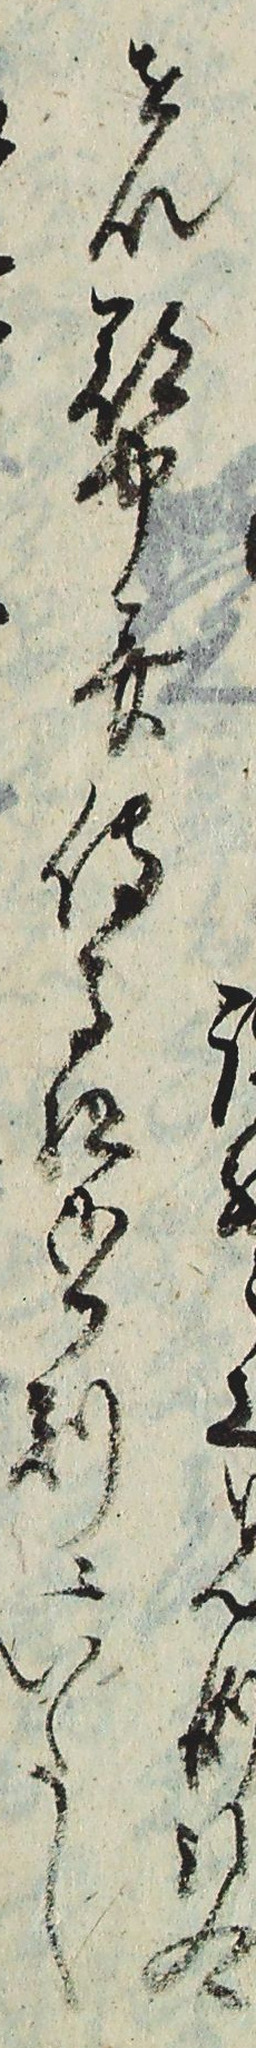を以郡中并伝馬組弐つ割にいたし
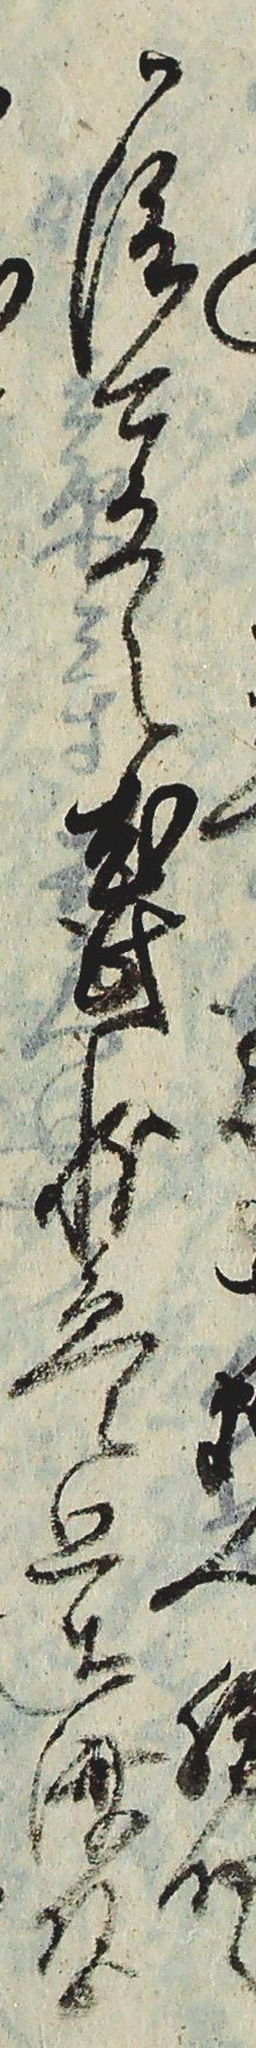御渡可有之候尤此状急々廻達済村ゟ
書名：名東郡中諸割賦元帳
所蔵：鳴門教育大学 Naruto University of Education
